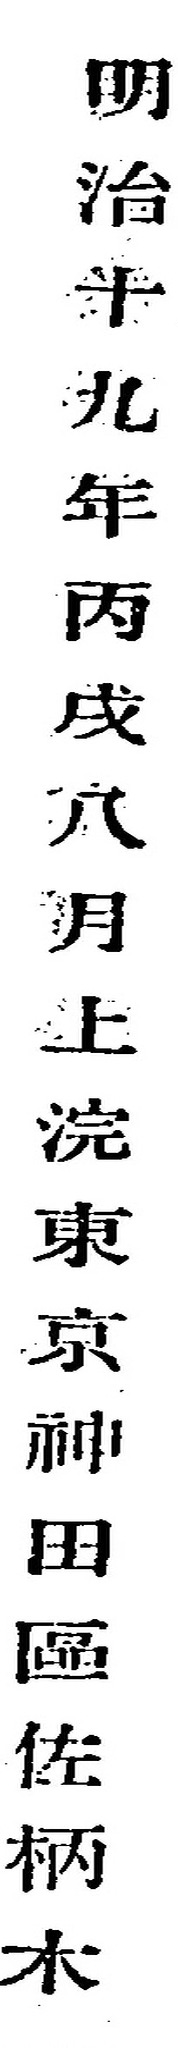明治十九年丙戌八月上浣東京神田区佐柄木

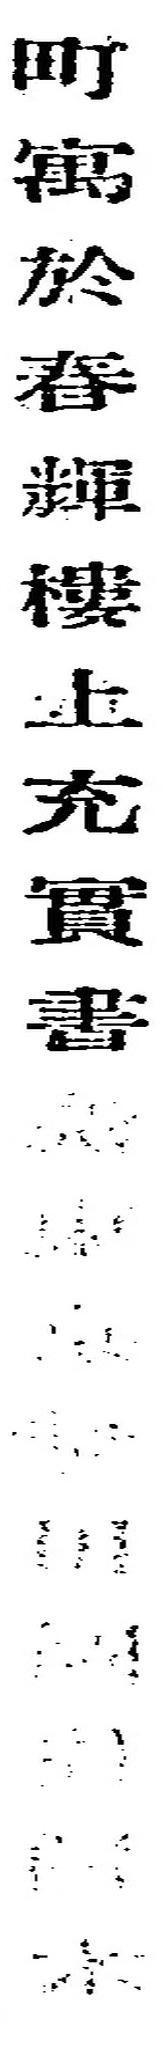町寓於春輝樓上充實書
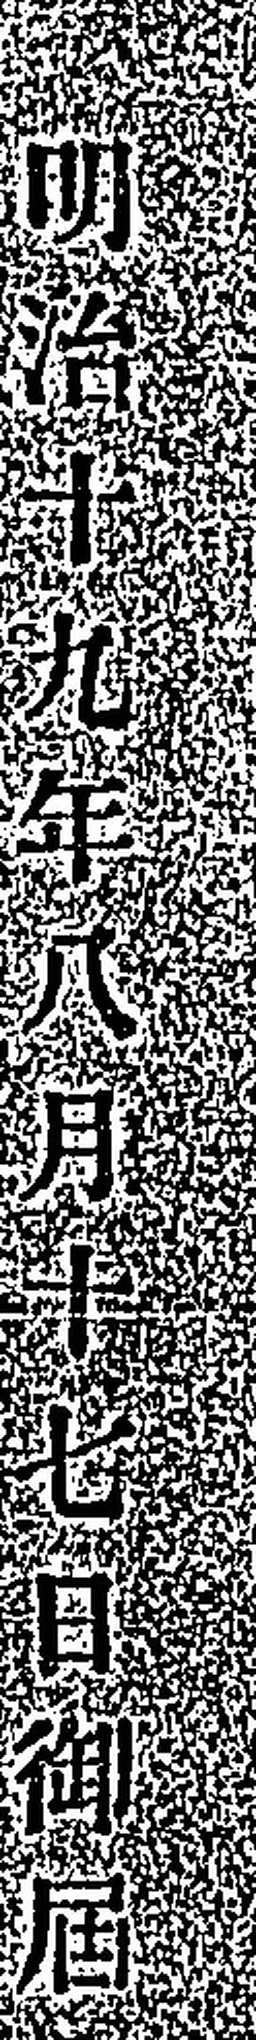明治十九年八月十七日御届

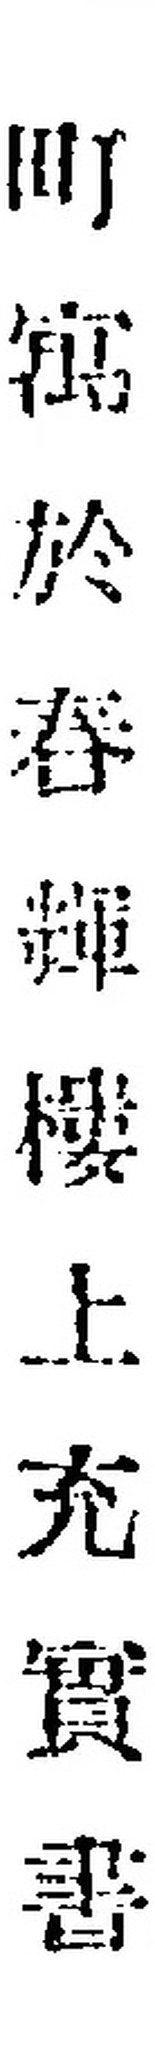町寓於春輝樓上充實書
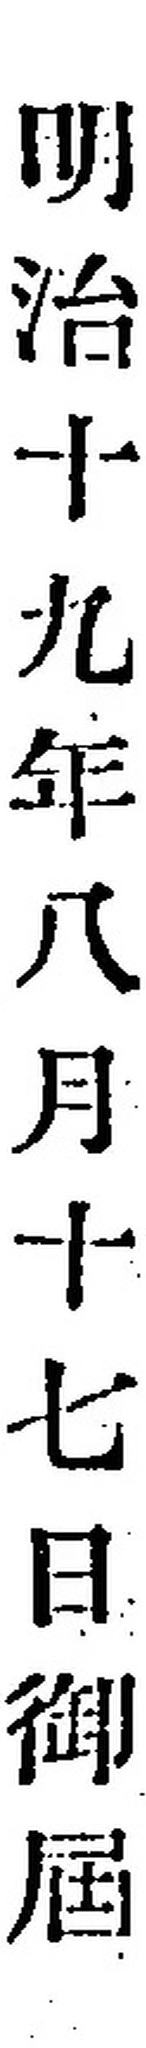明治十九年八月十七日御届
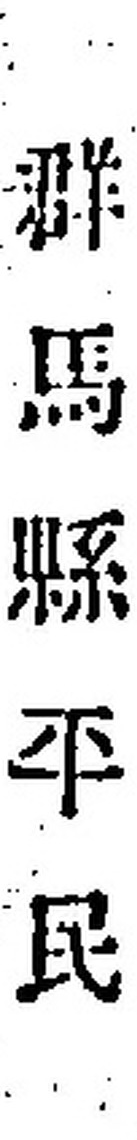群馬県平民
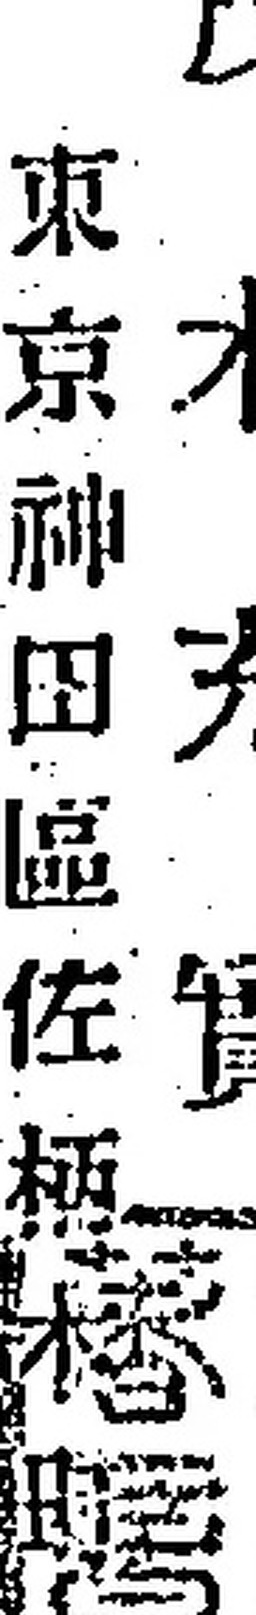東京神田区佐柄木
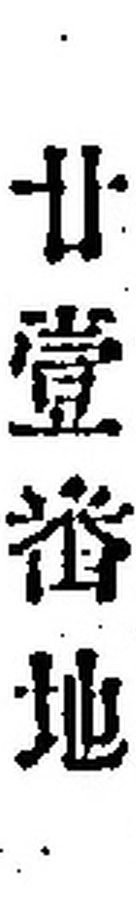廿壱番地
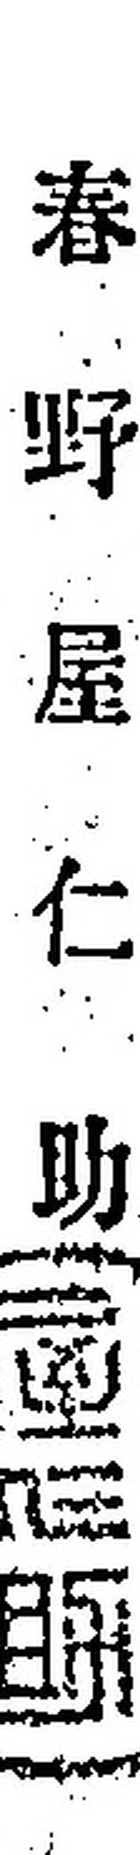春野屋仁助
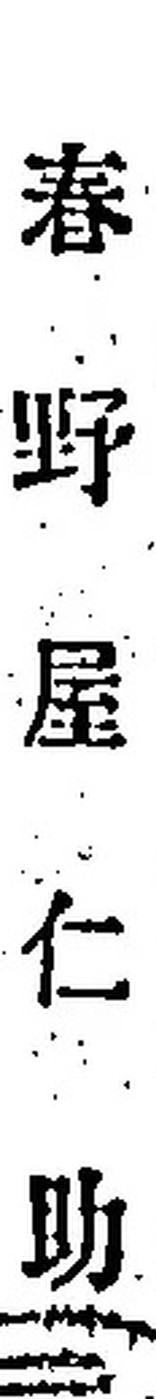春野屋仁助
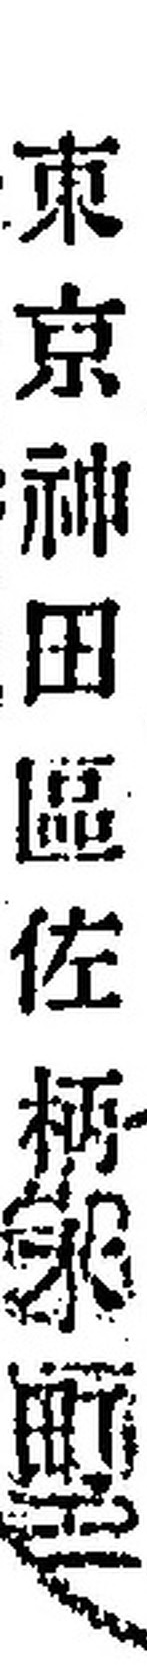東京神田区佐柄木
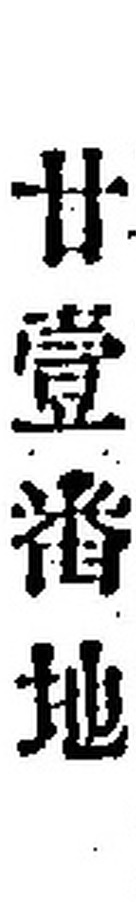廿壱番地
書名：駆疫法 : コレラヲヨケ並ニナホスシカタ
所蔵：国立国会図書館 National Diet Library, JAPAN
